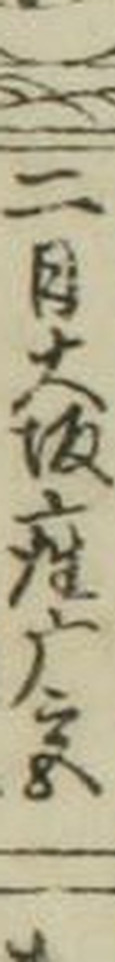二日大坂座摩宮
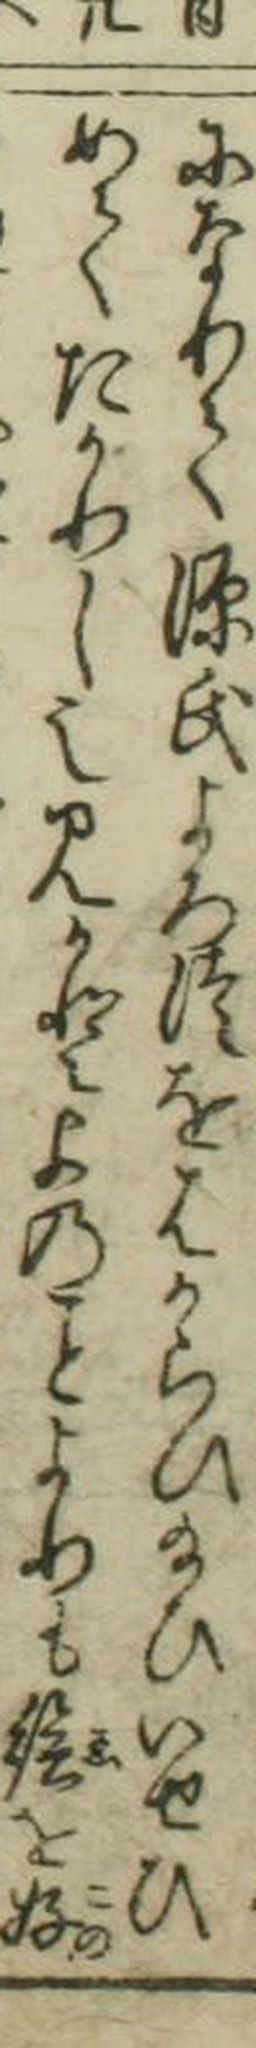めてたかりし也みかとよのことよりも絵を好
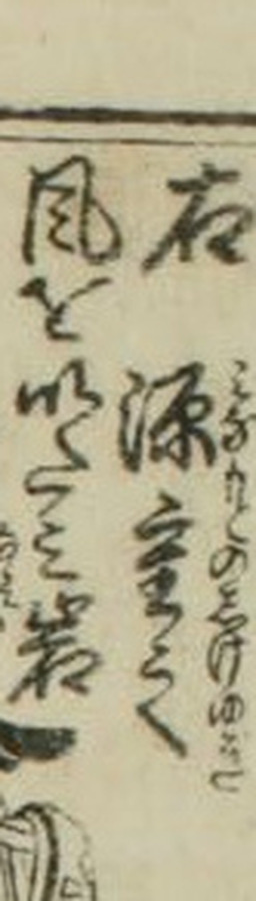風をいたみ岩
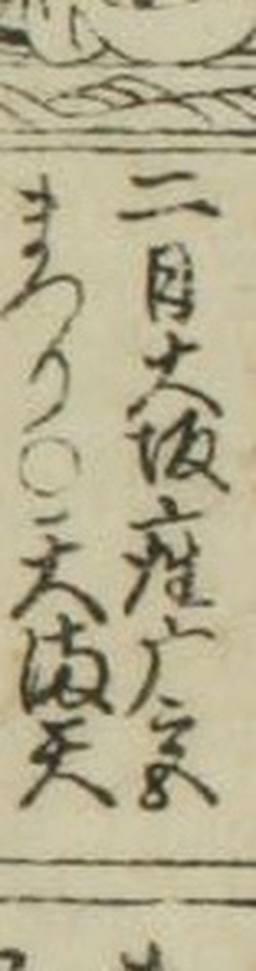まつり○天満天
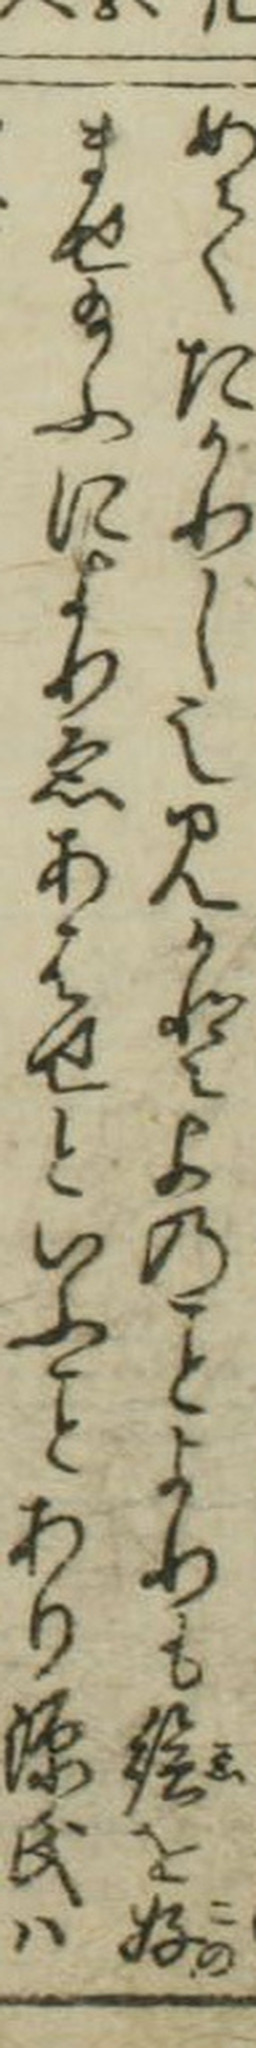ませ給ふによりゑあはせといふことあり源氏は
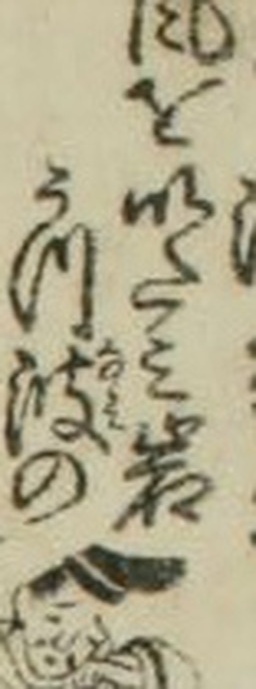うつ波の
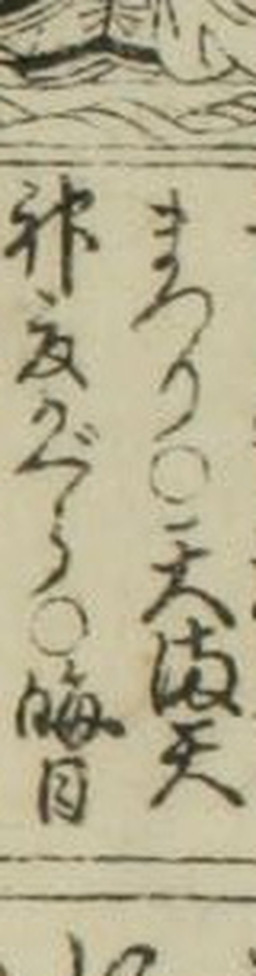神夏かぐら○晦日
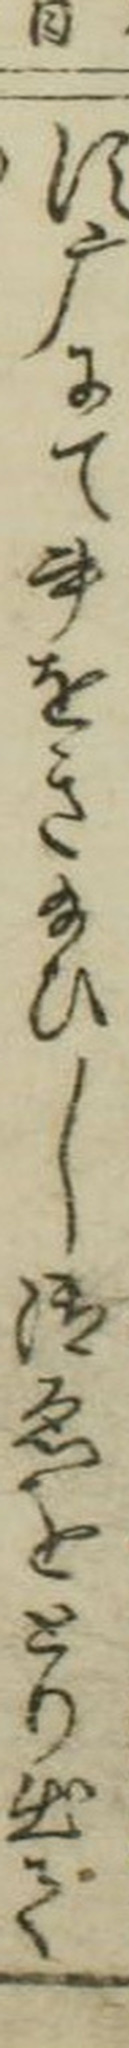須磨にて書をき給ひし御ゑをとり出で
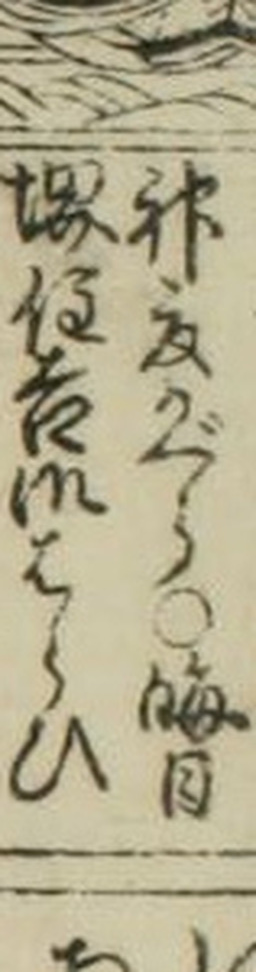堺住吉御はらひ
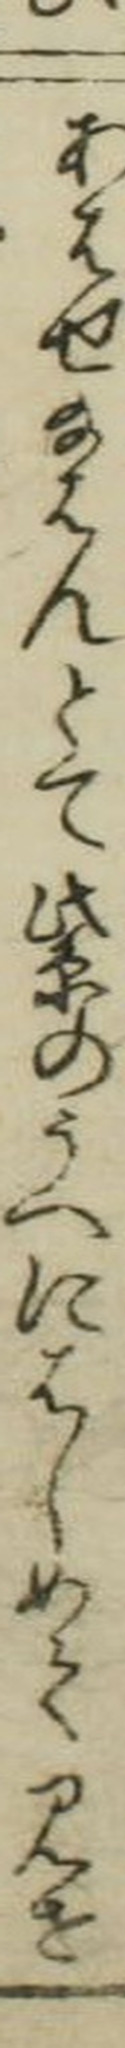あはせ給はんとて紫のうへにはしめて見せ
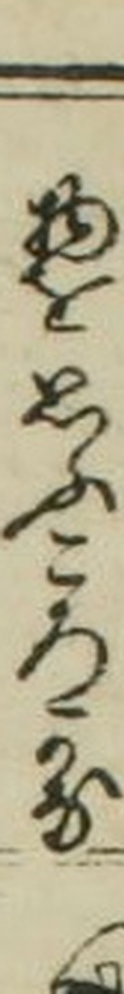物を思ふころかな
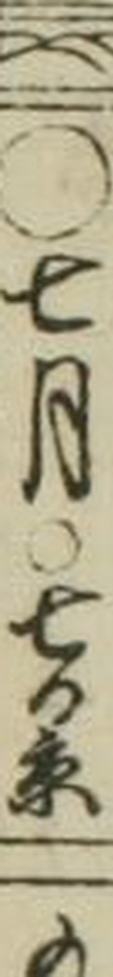○七月◯七日京
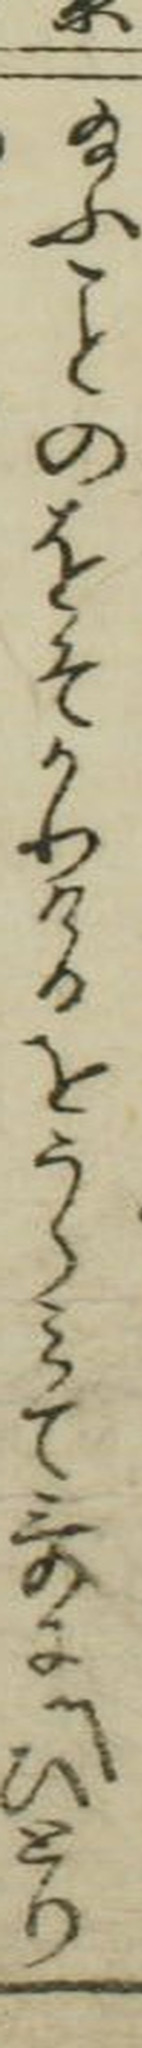給ふことのをそかりけるをうらみて哥に〽ひとり
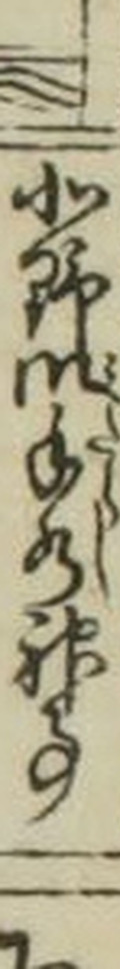北野御手水神事
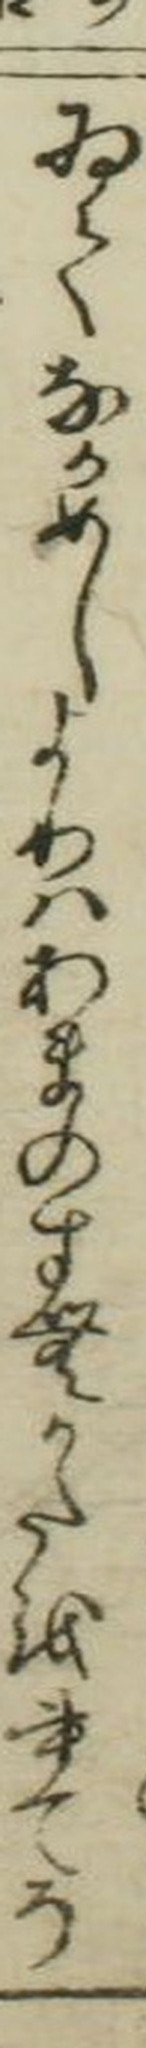ゐてなかめしよりはあまのすむかたを書てそ
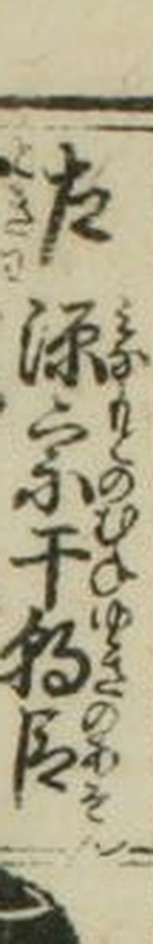左源宗于朝臣
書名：女源氏教訓鑑
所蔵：東京学芸大学附属図書館
